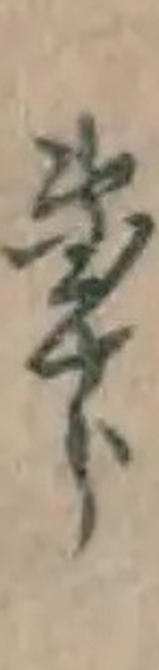團十郎
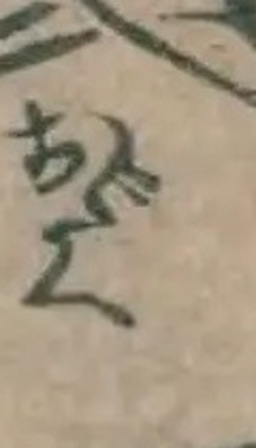おだへ
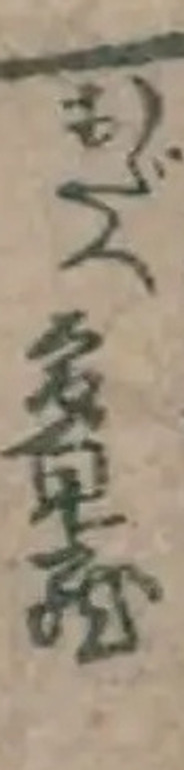おだへ多見蔵
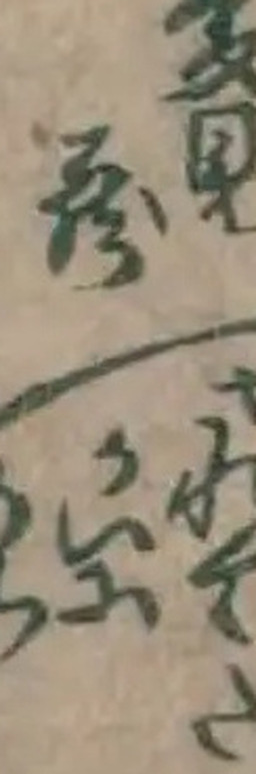かいに
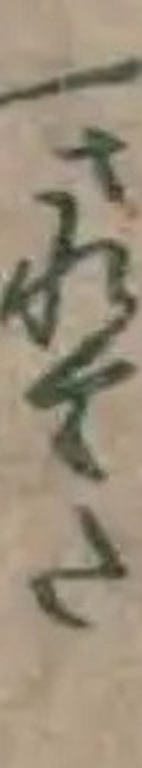されてた
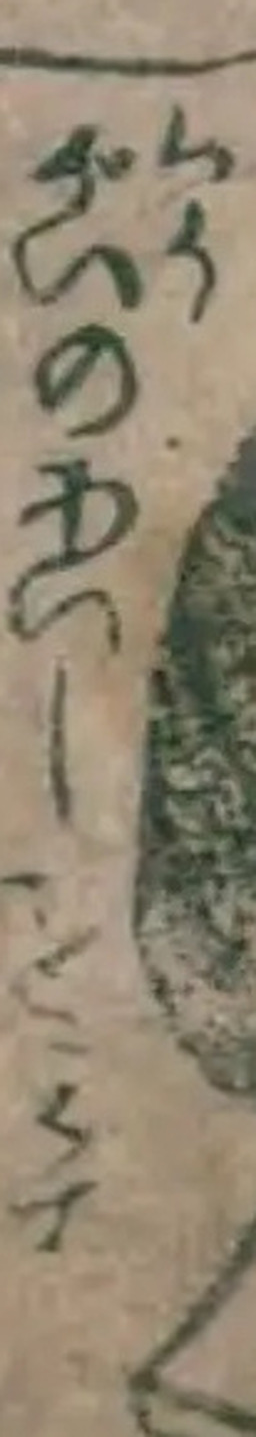がいのあいしをみて
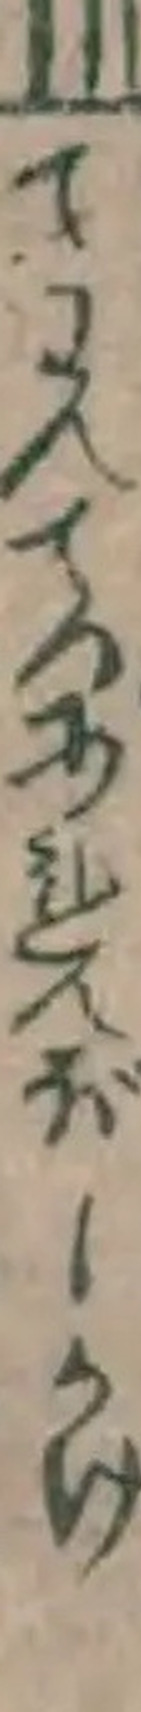てわんてつにれんぼしかけ
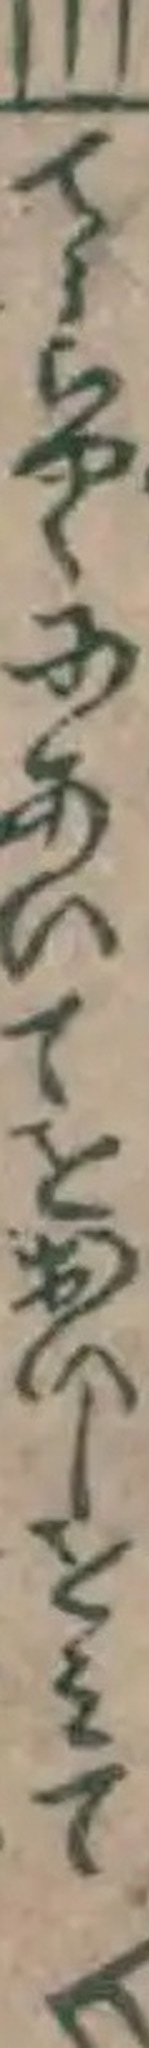てうちやくにあいてをおいしをみて
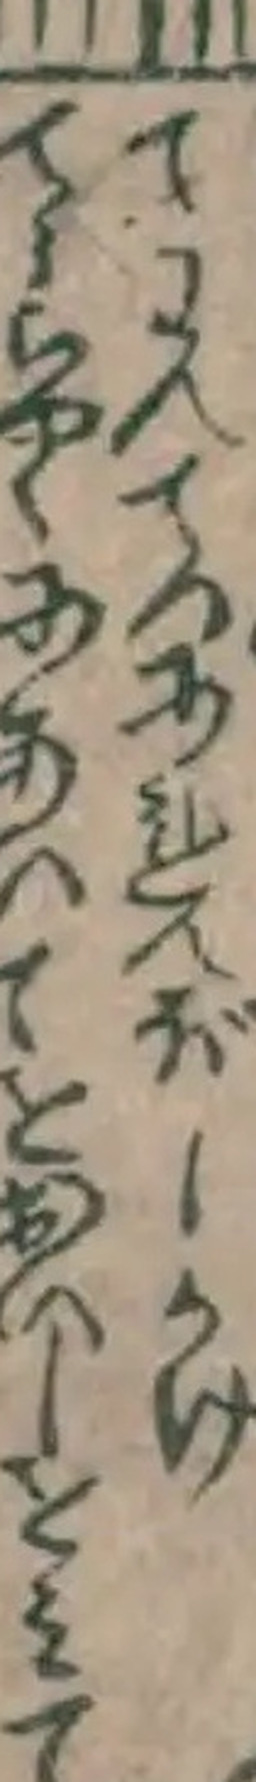てうちやくにあいてをおいしをみて
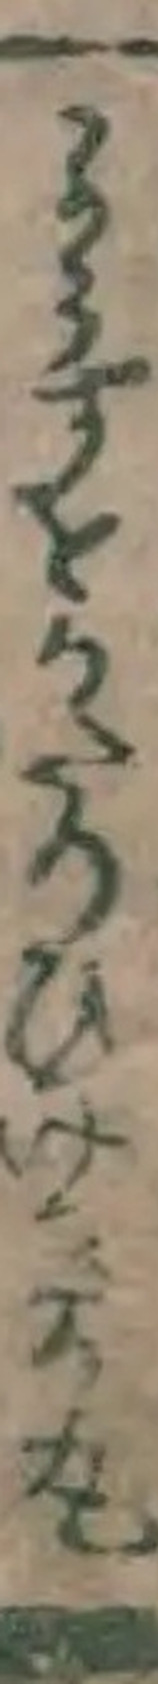ようすをかたりひけきり丸
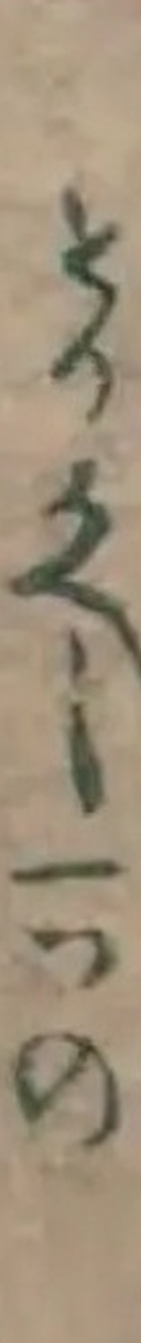とりかへし一つの
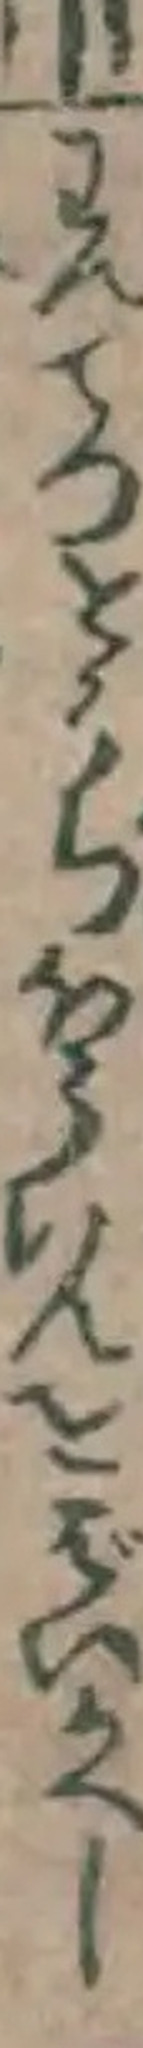わんてつとうちほうけんをばいかへし
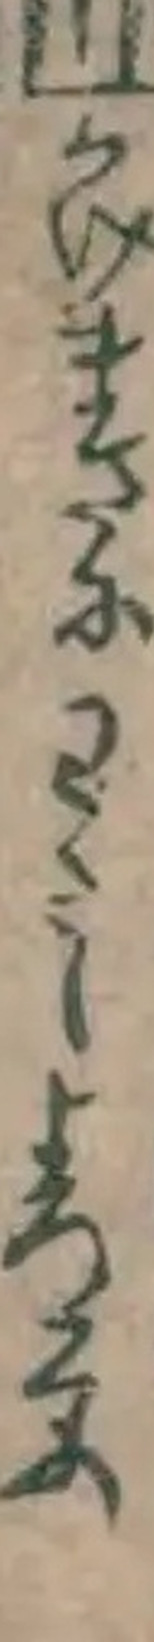かけまさにわたしよろこふ
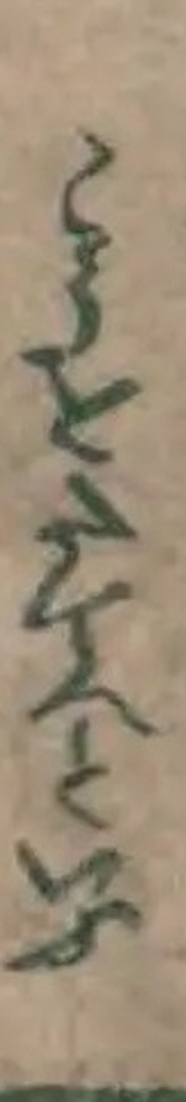こうをたてんといふ

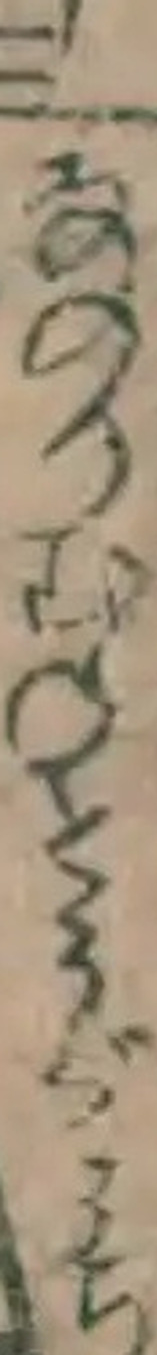なのりむねとうがうち
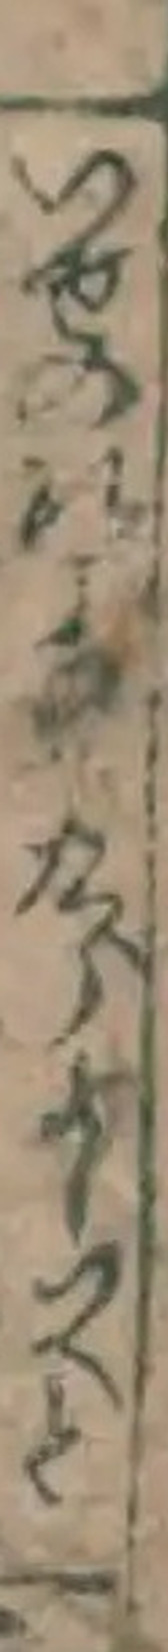いせの次次郎又九郎よしいへと
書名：伊達錦對将 : 森田座
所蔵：国立国会図書館 National Diet Library, JAPAN
